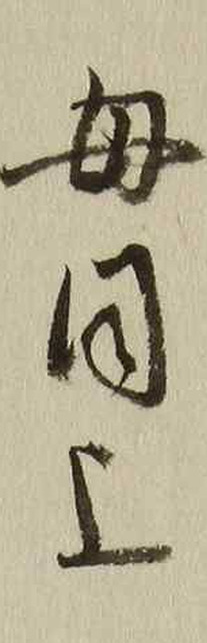母同上
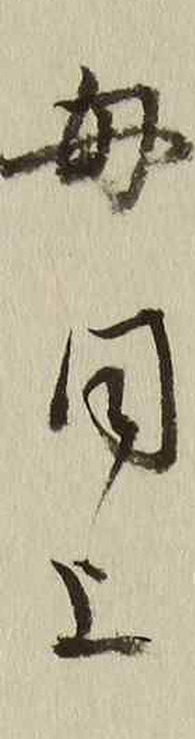母同上
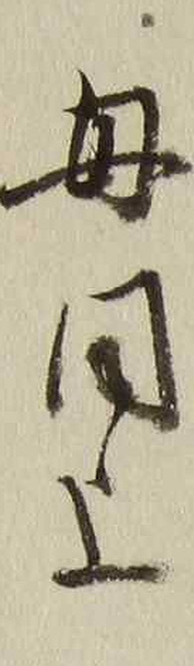母同上

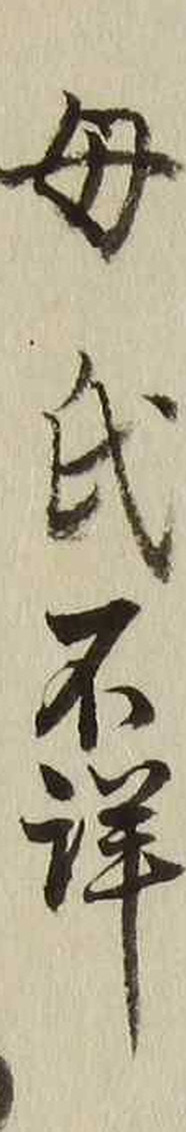母氏不詳
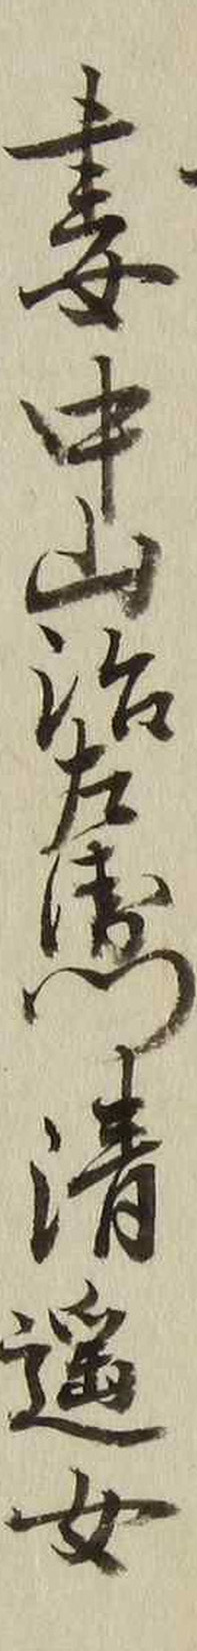妻中山治左衛門清遥女
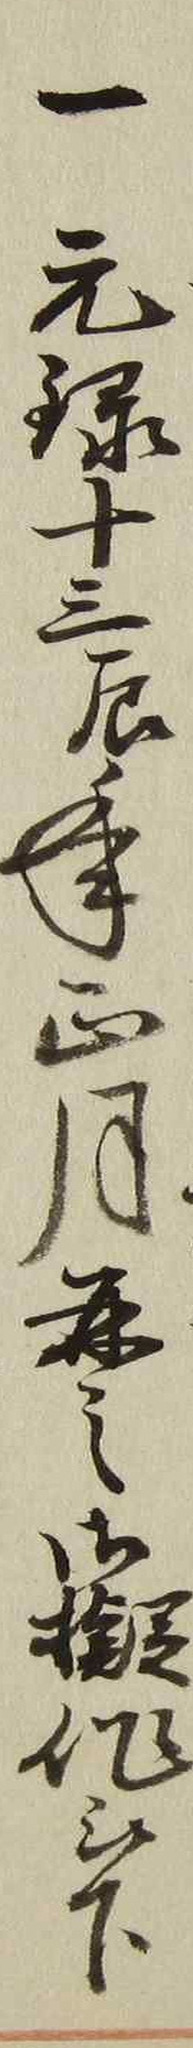一元禄十三辰年正月再之擬作被下
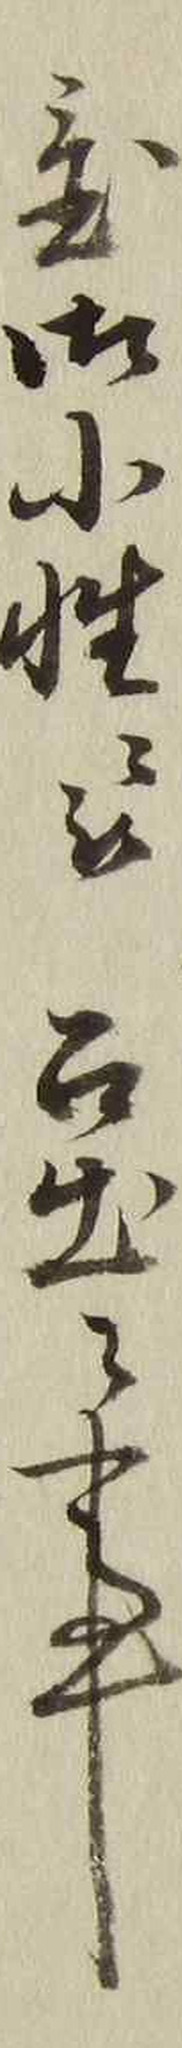置御小性ニ被召出候事
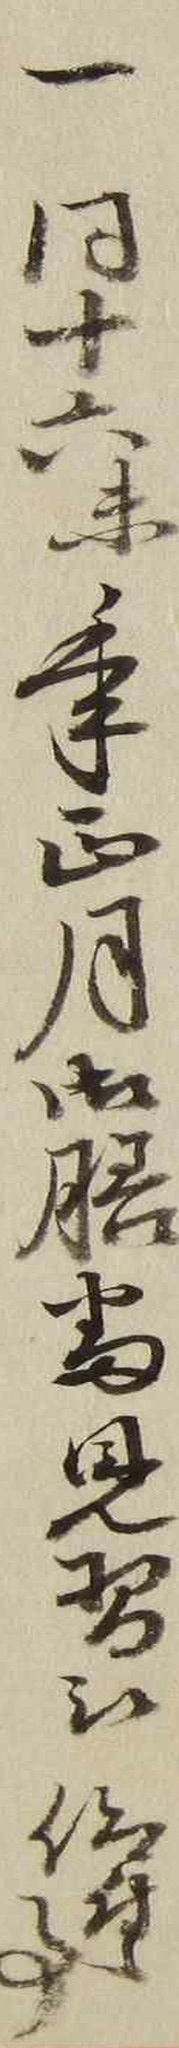一同十六未正月御膳番見習被仰付候事
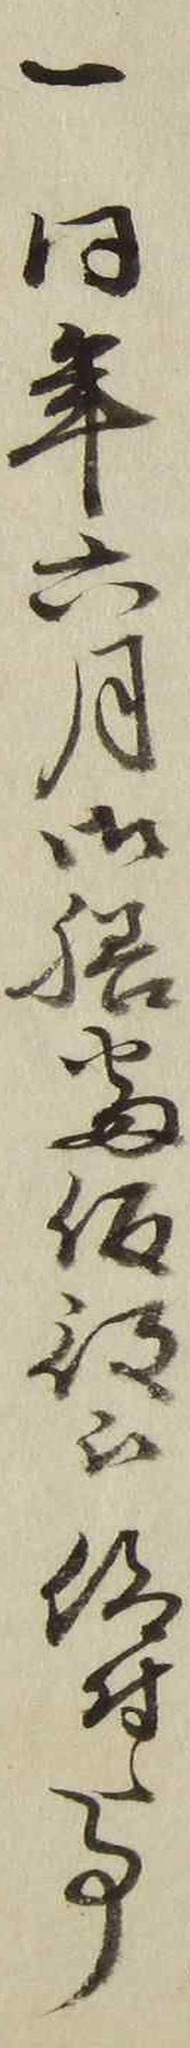一同年六月御膳番仮役被仰付候事
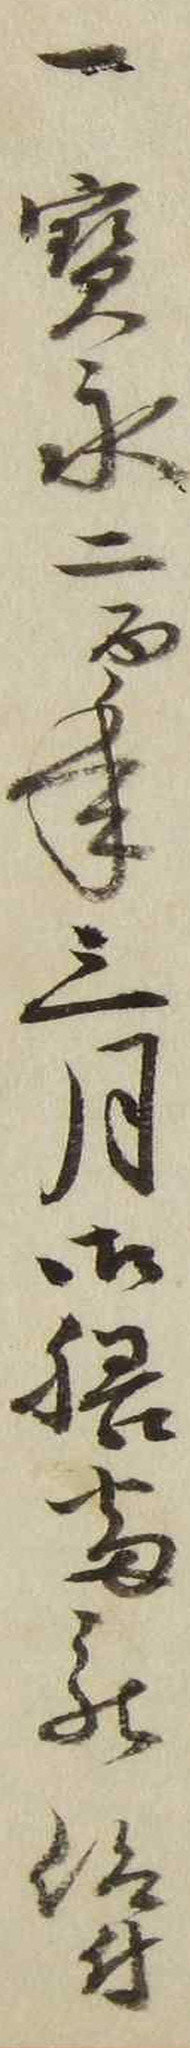一宝永二酉年三月御膳番被仰付

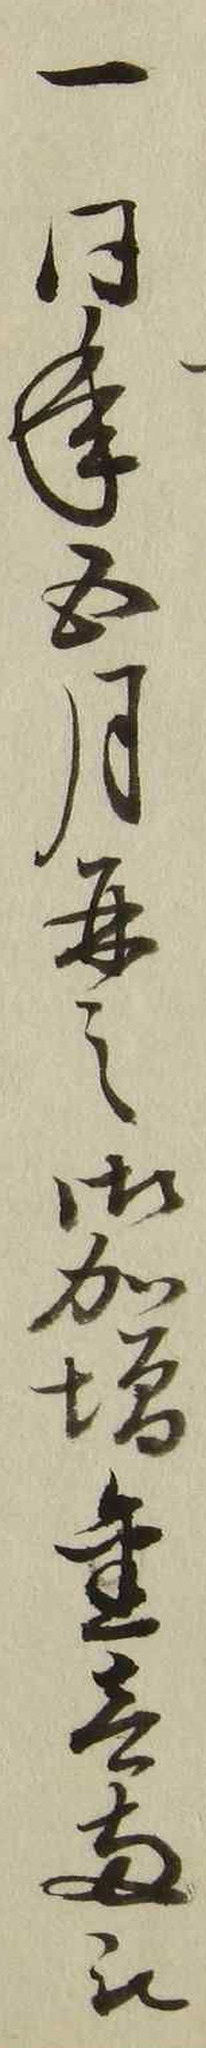一同年五月再之御加増金壱両被
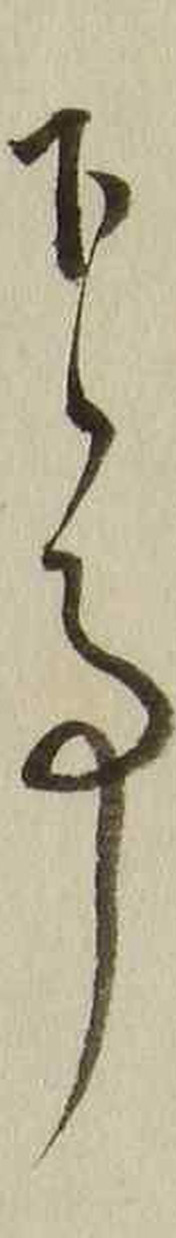下候事
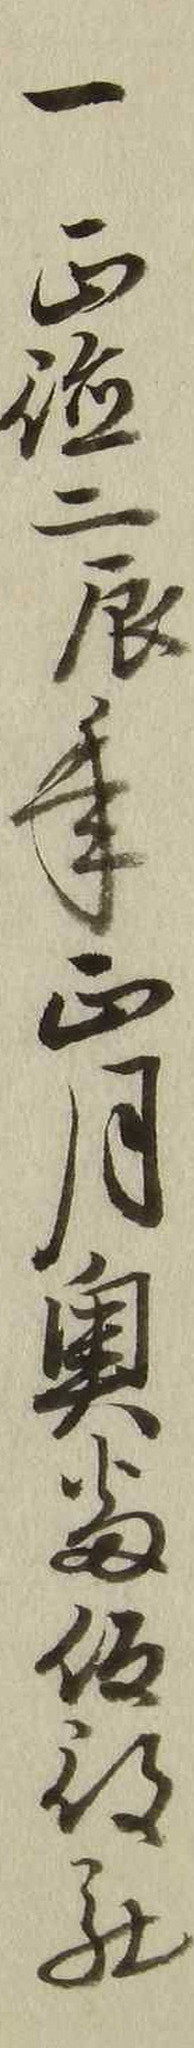一正徳二辰年正月奥番仮役被
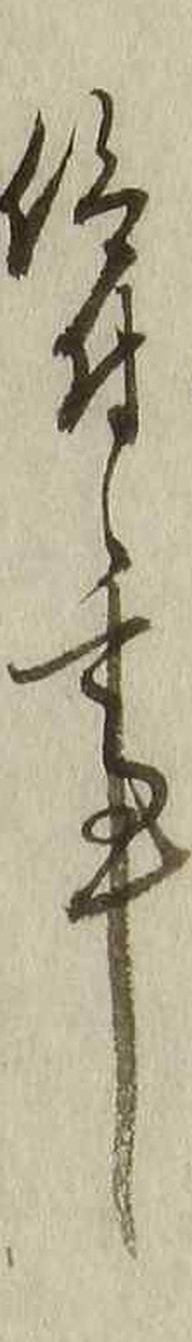仰付候事
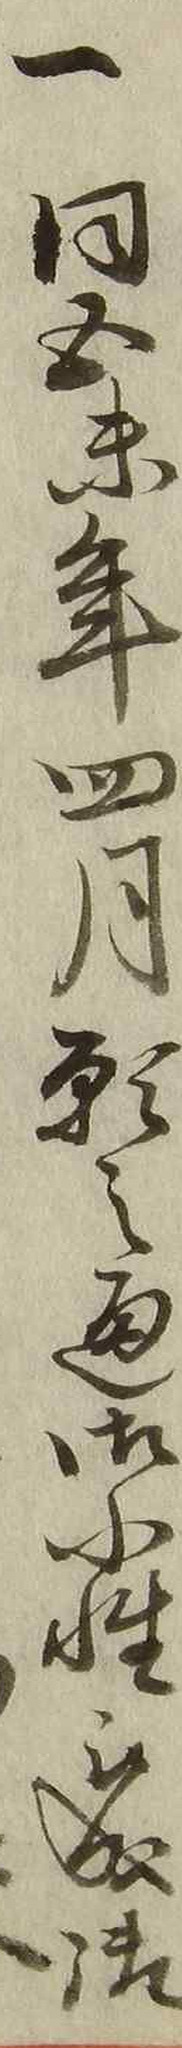一同五未年四月願之通御小性被成御
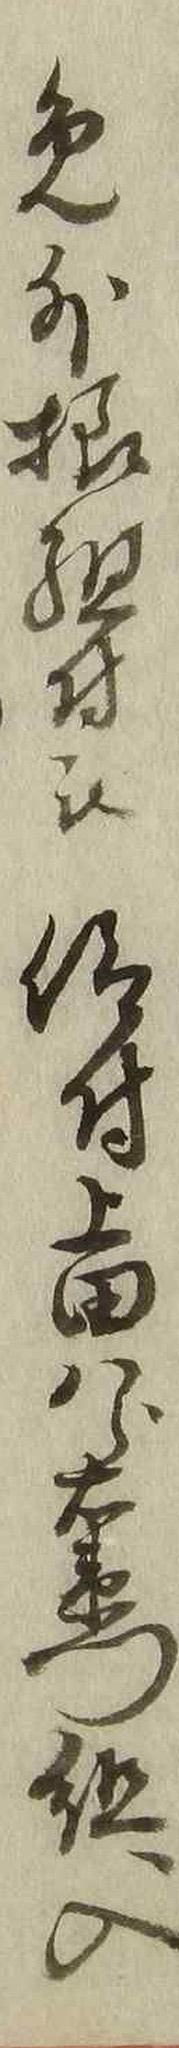免外様組付被仰付上田八郎右衛門組へ入
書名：諸士系譜　巻之53　に之部4
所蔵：会津若松市立会津図書館
